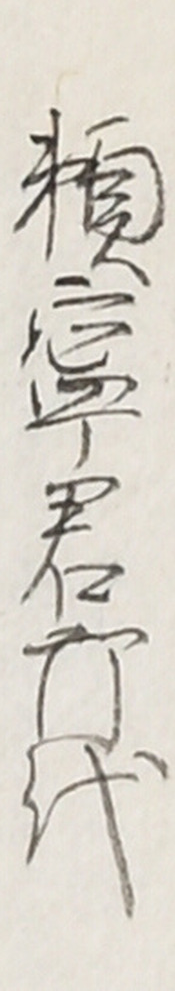頼寧君御代
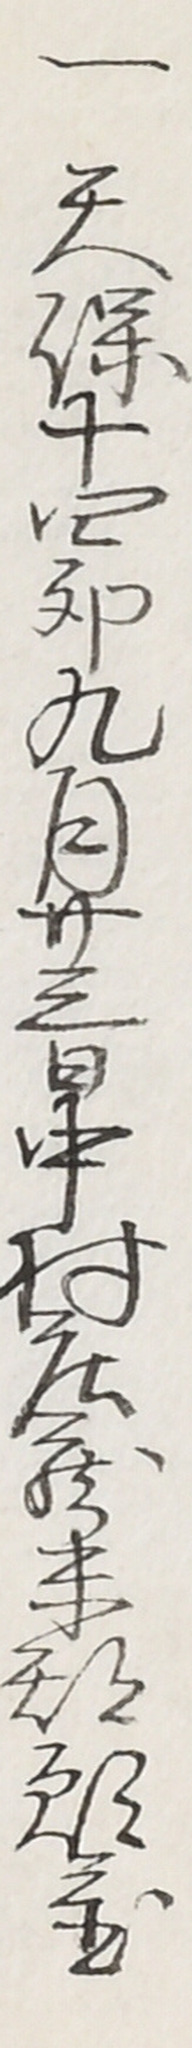一天保十四卯九月廿三日中村庄蔵末期願置
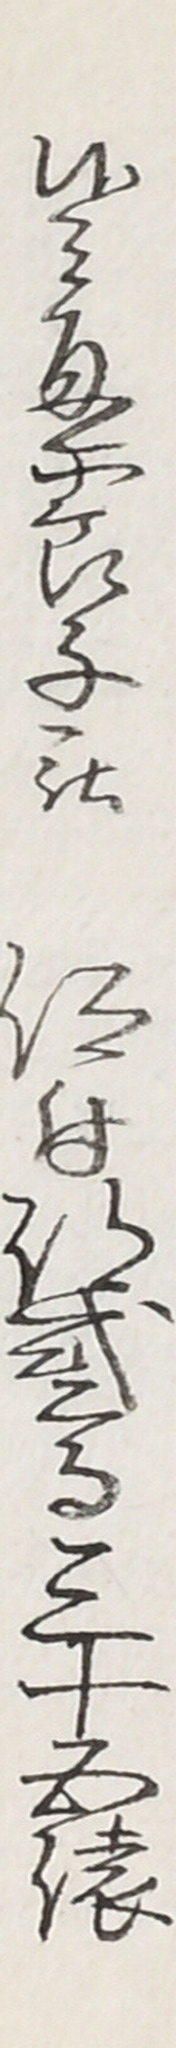候之通養子被仰付跡式高三十五俵
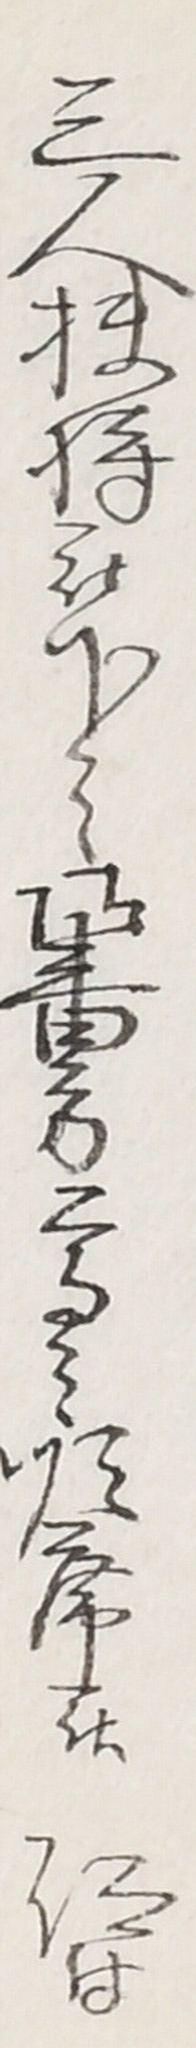三人扶持被下之御番方高之順席被仰付
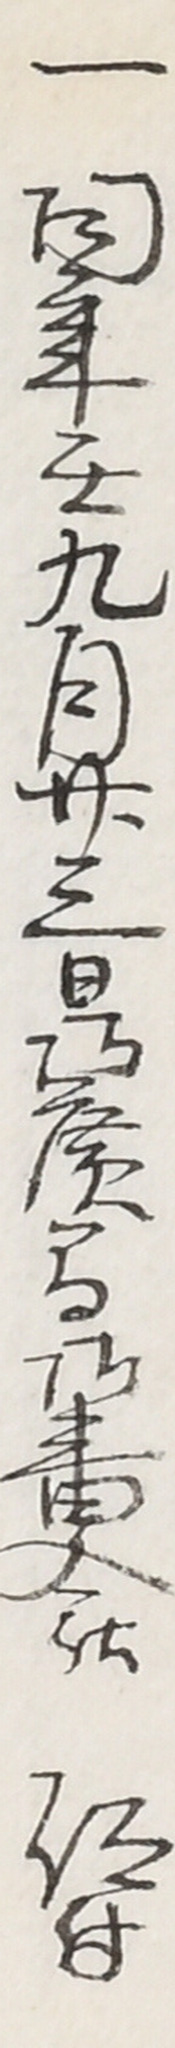一同年閏九月廿三日御広間御番入被仰付

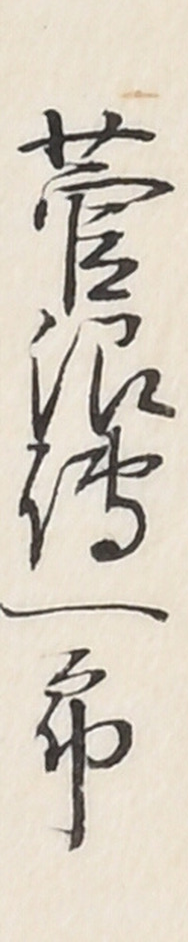菅沼伝一郎
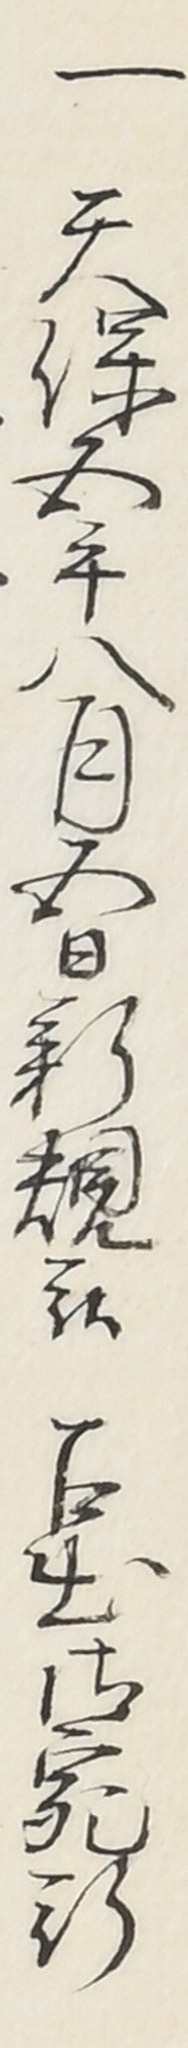一天保五午八月五日新規被召出御宛行
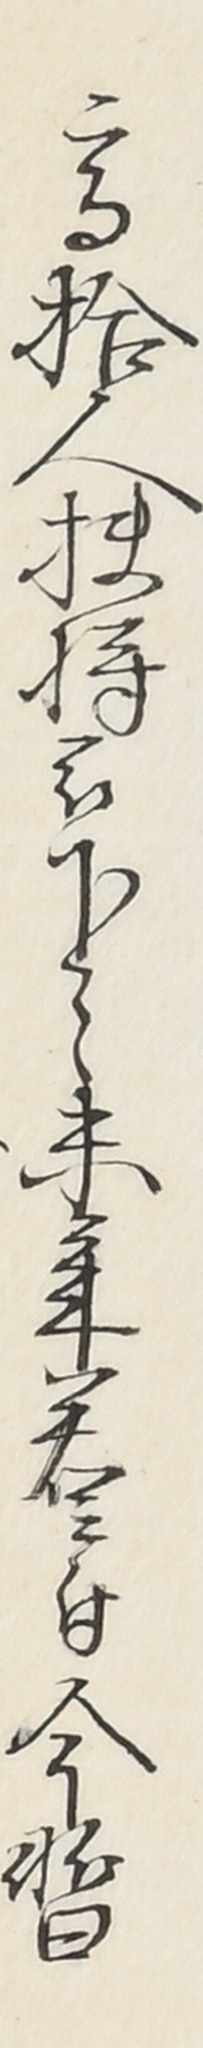高拾人扶持被下之未年若ニ付今暫
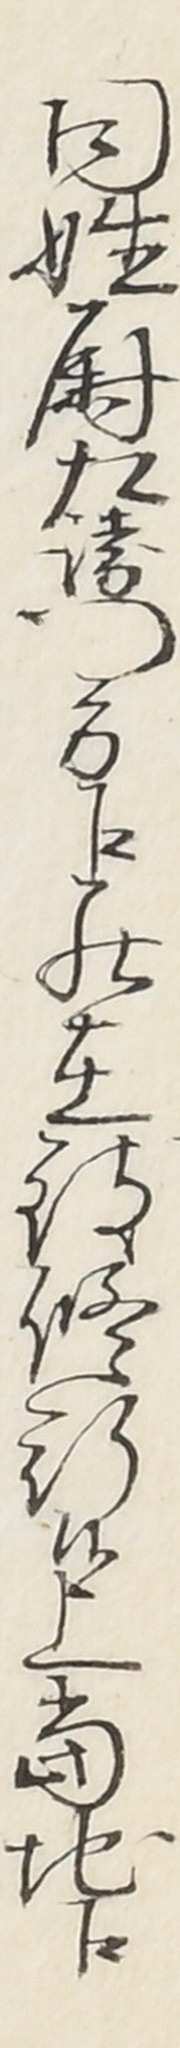同姓尉左衛門方江罷在致修業候上当地江
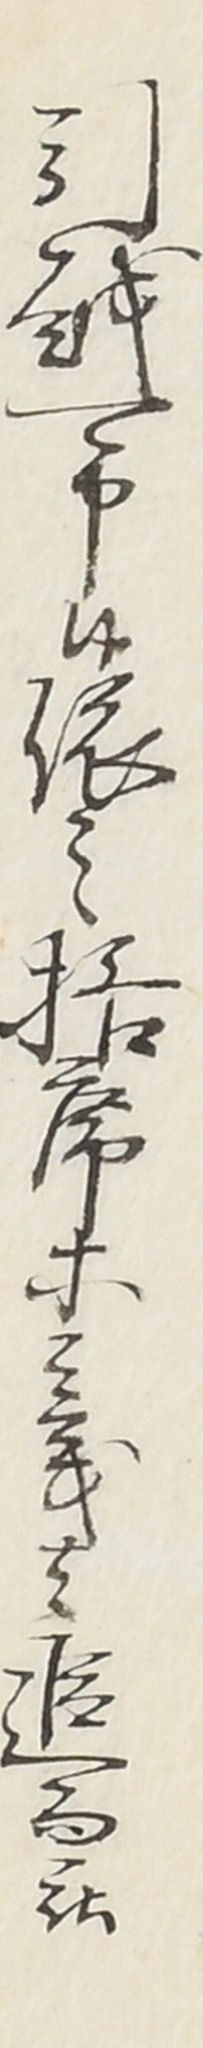引越可申候依之格席等之義は追而被
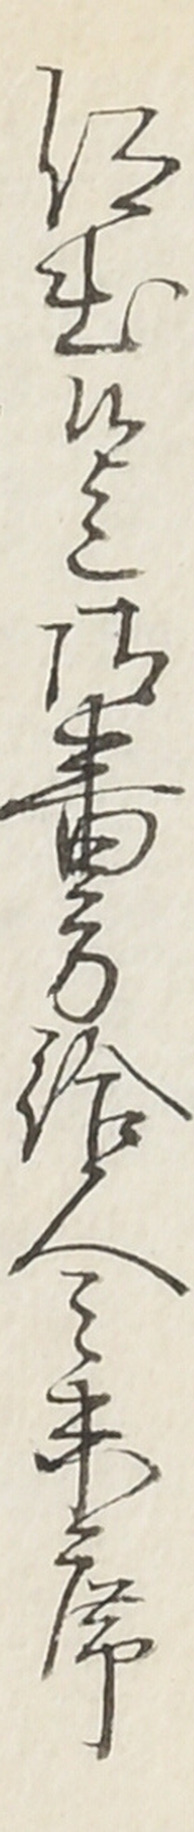仰出候迄御番方給人之末席
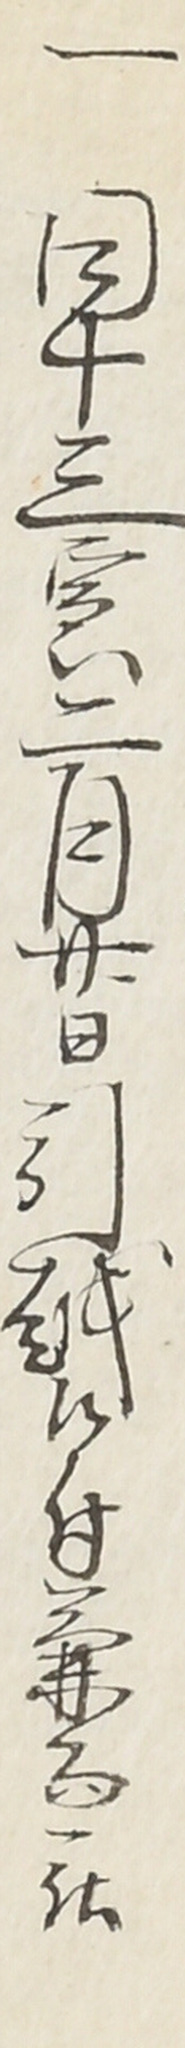一同十三寅二月廿日引越候付兼而被
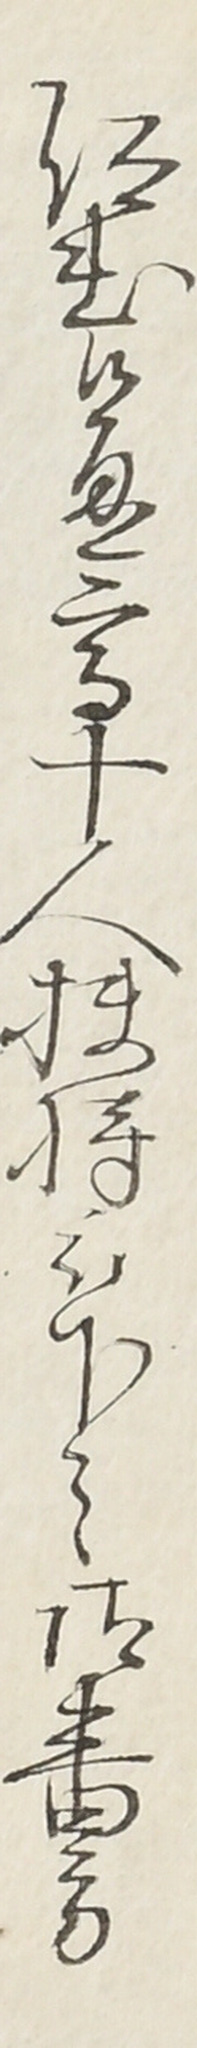仰出候通高十人扶持被下之御番方
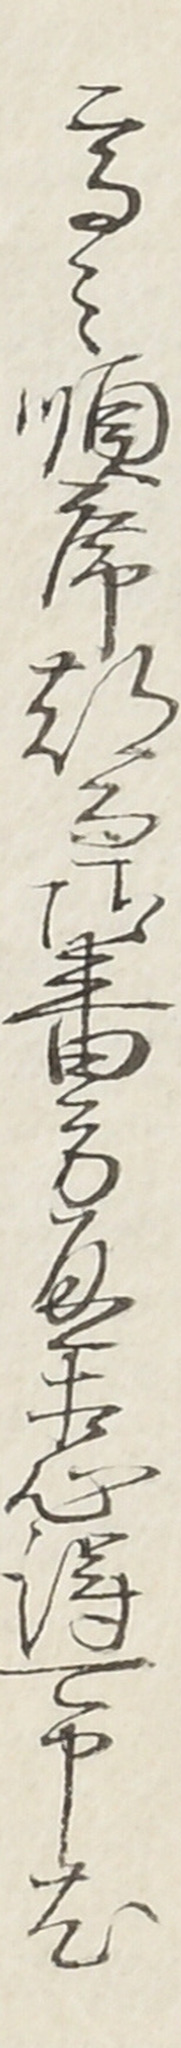高之順席都而御番方通相心得可申尤
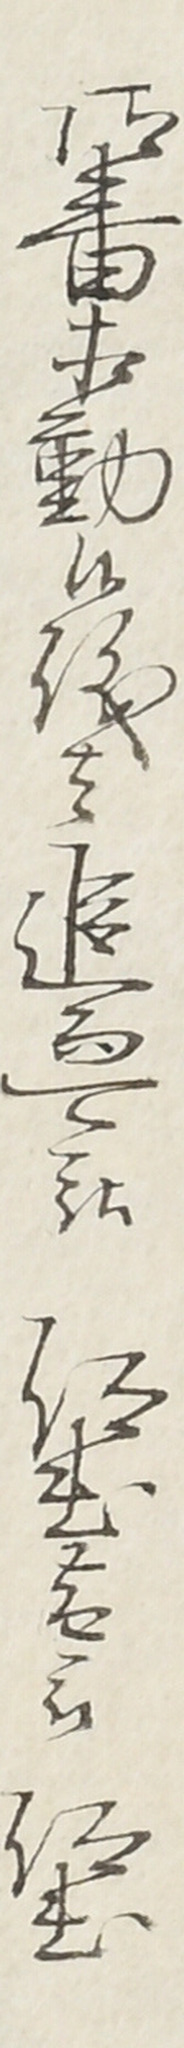御番相勤候儀は追而可被仰出旨被仰出
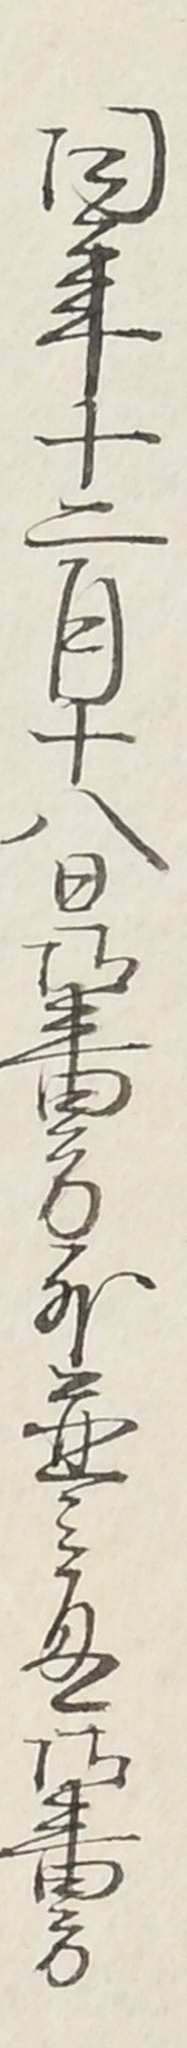一同年十二月十八日御番方外並之通御番方
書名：給人諸士勤仕録（七）
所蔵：伊那市立高遠町図書館・合同会社AMANE
